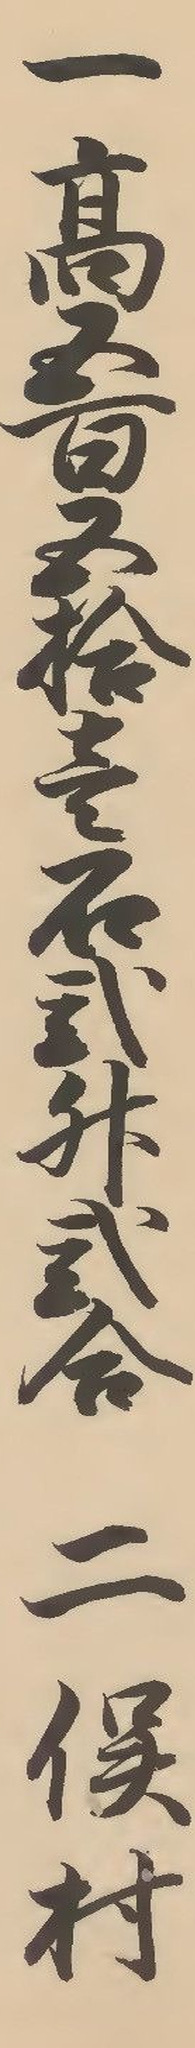一髙五百五拾壱石弐升弐合二俣村
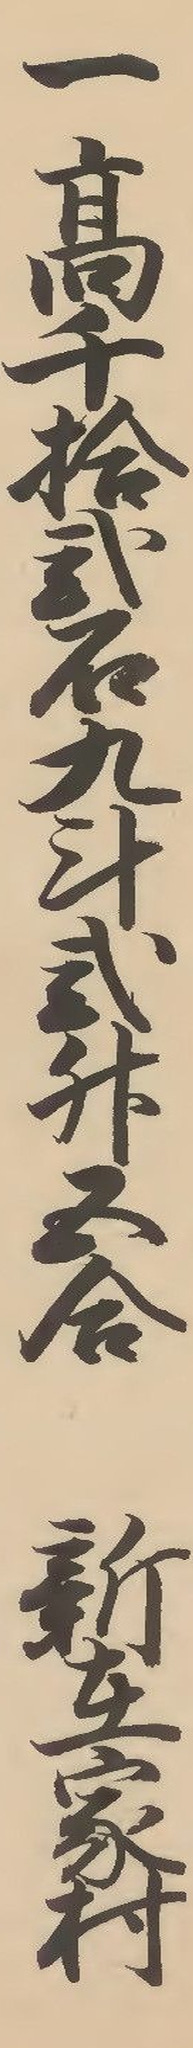一髙千拾弐石九斗弐升五合新在家村
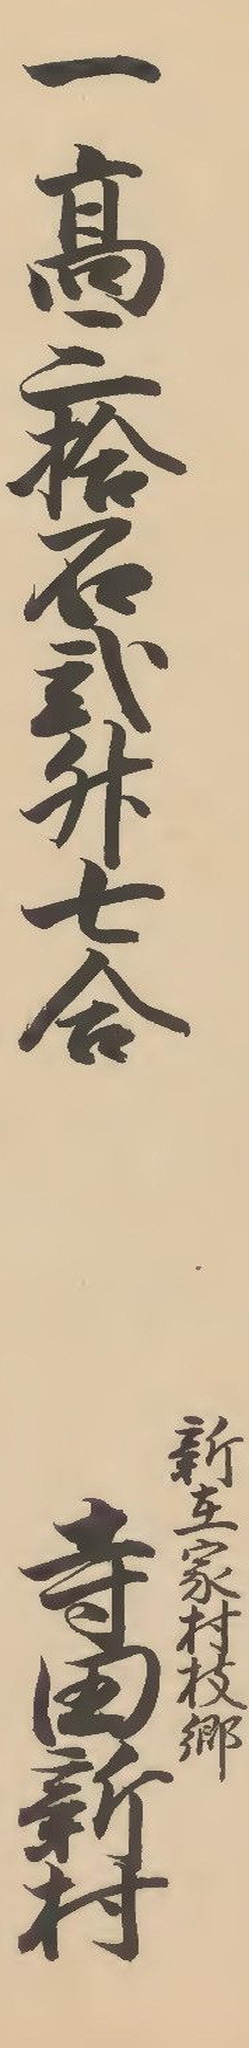一髙三拾石弐升七合寺田新村
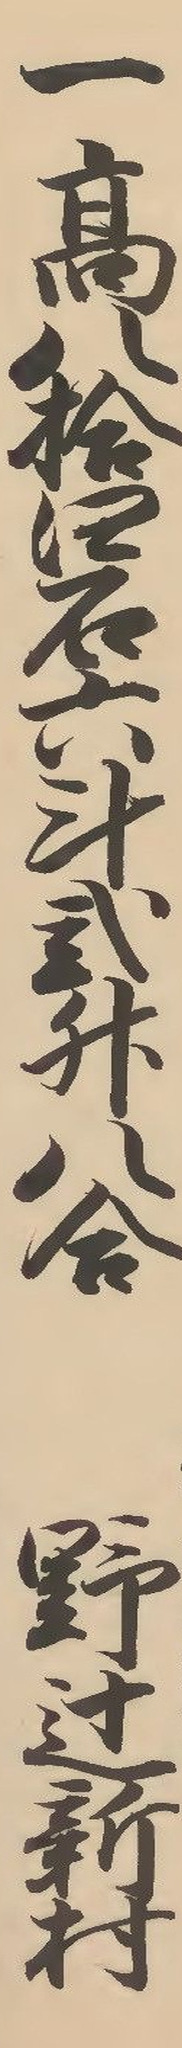一髙八拾四石六斗弐升八合野辻新村
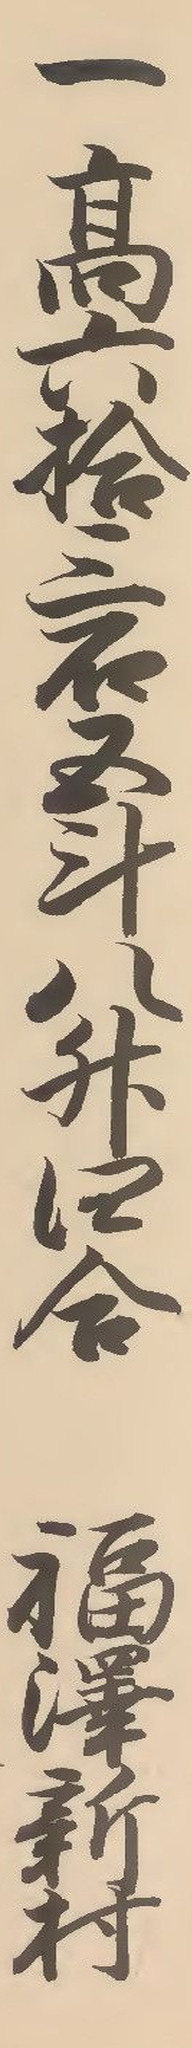一髙六拾三石五斗八升四合福澤新村
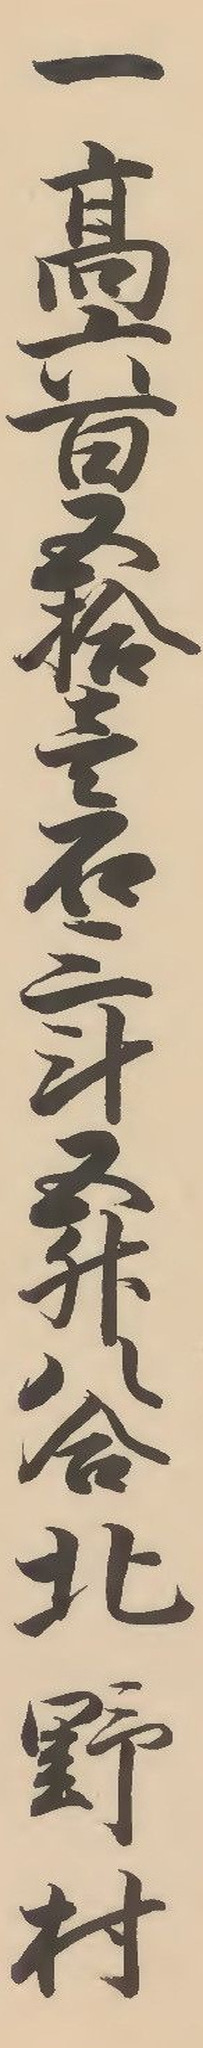一髙六百五拾壱石三斗五升八合北野村
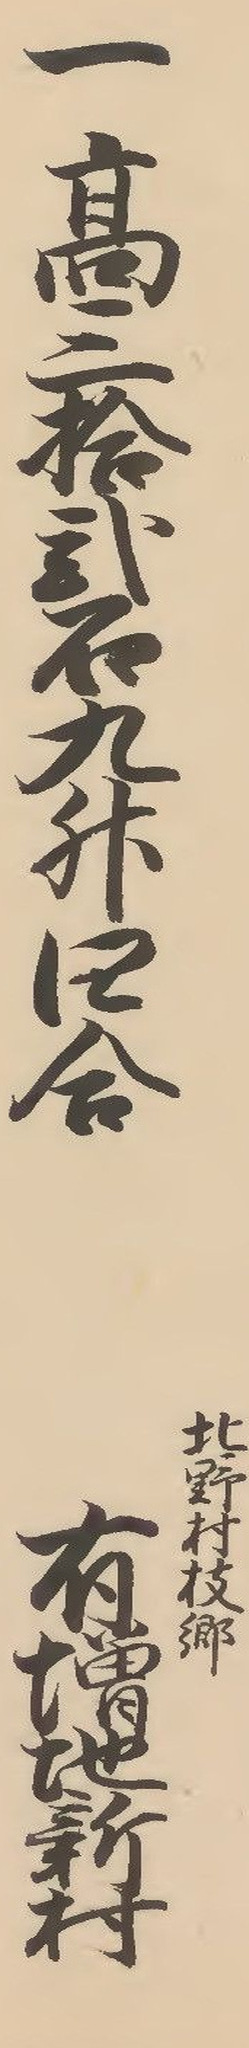一髙三拾弐石九升四合有増地新村
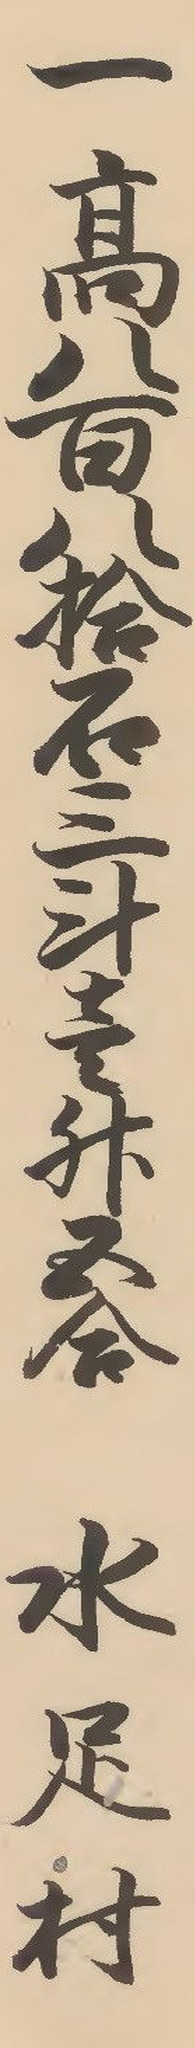一髙八百八拾石三斗壱升五合水足村

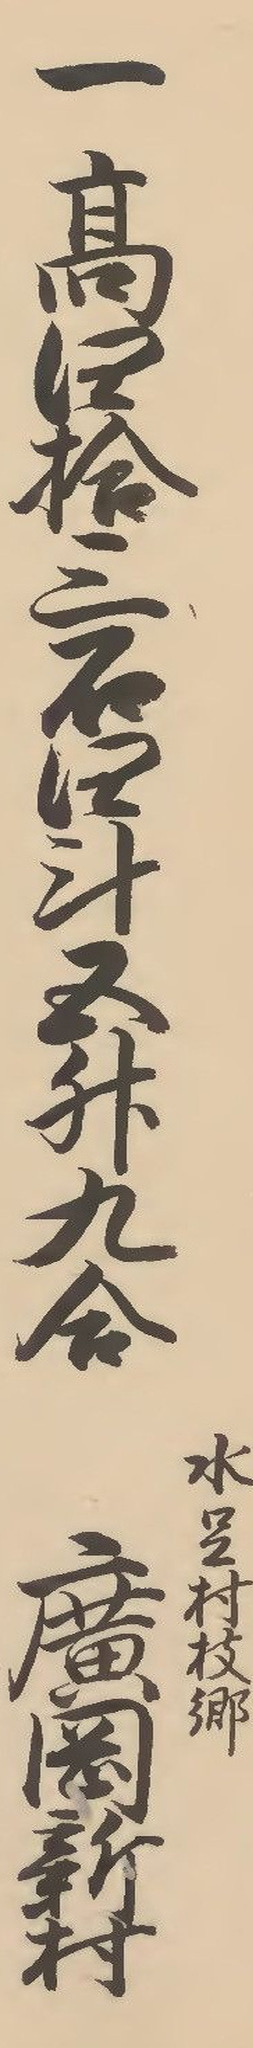一髙四拾三石四斗五升九合廣岡新村
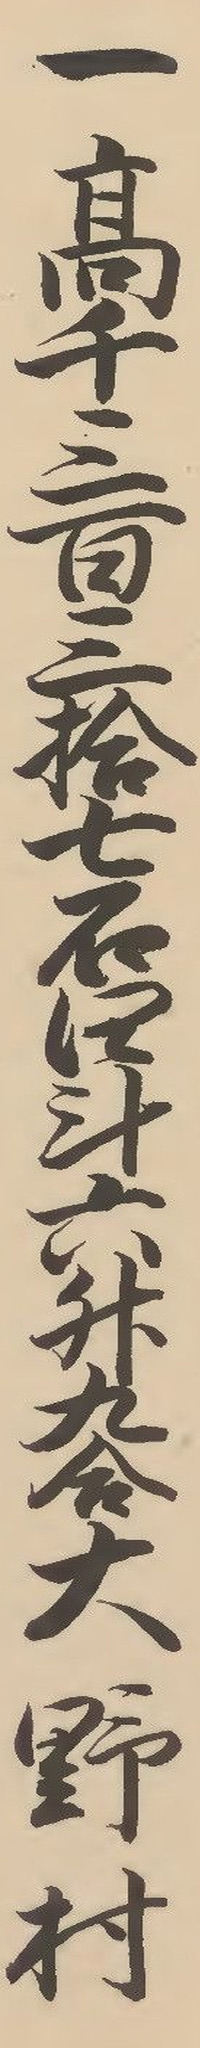一髙千三百三拾七石四斗六升九合大野村
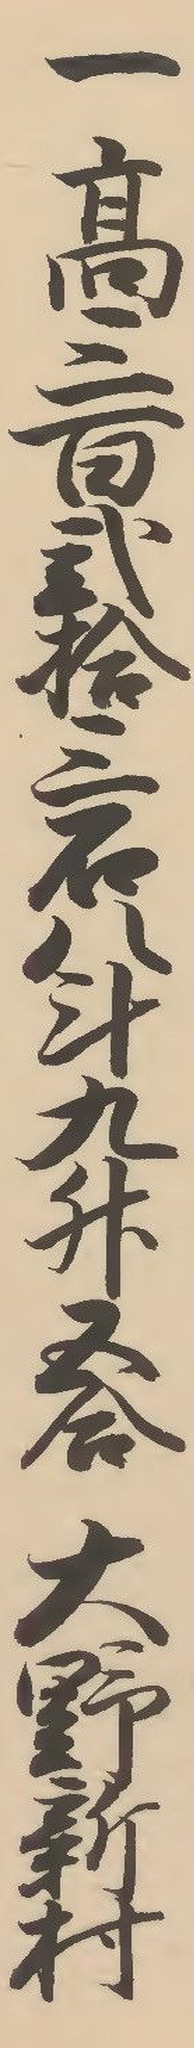一髙三百弐拾三石八斗九升五合大野新村
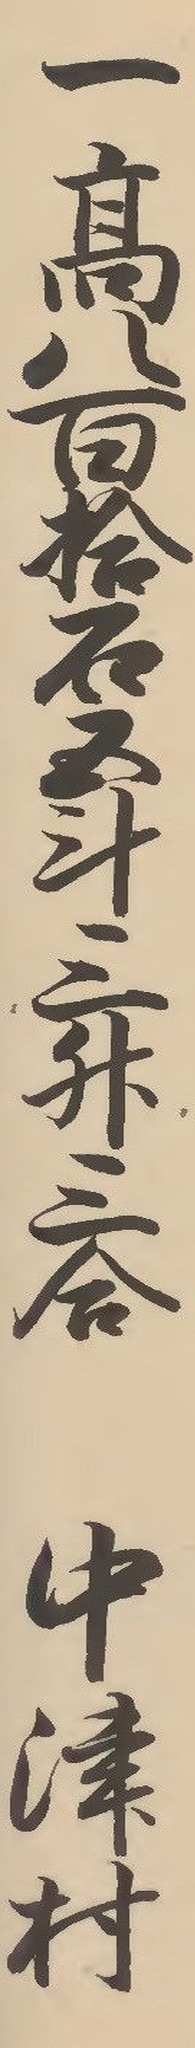一髙八百拾石五斗三升三合中津村
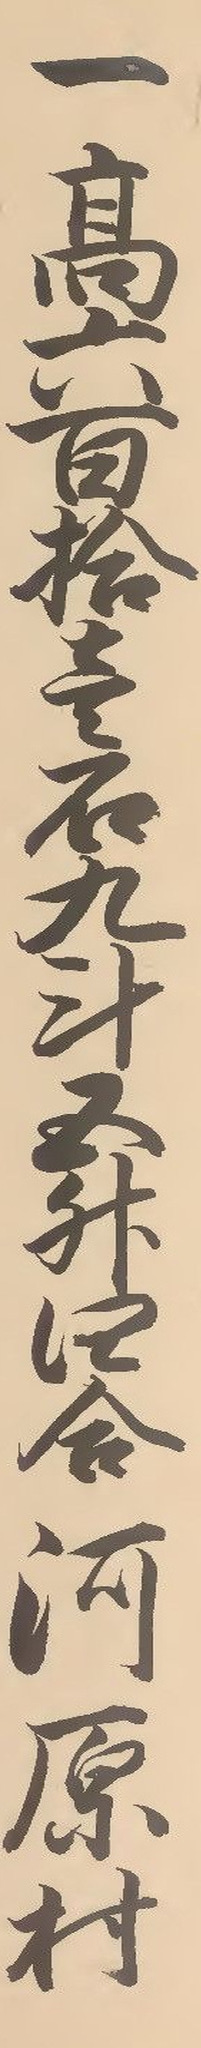一髙六百拾壱石九斗五升四合河原村
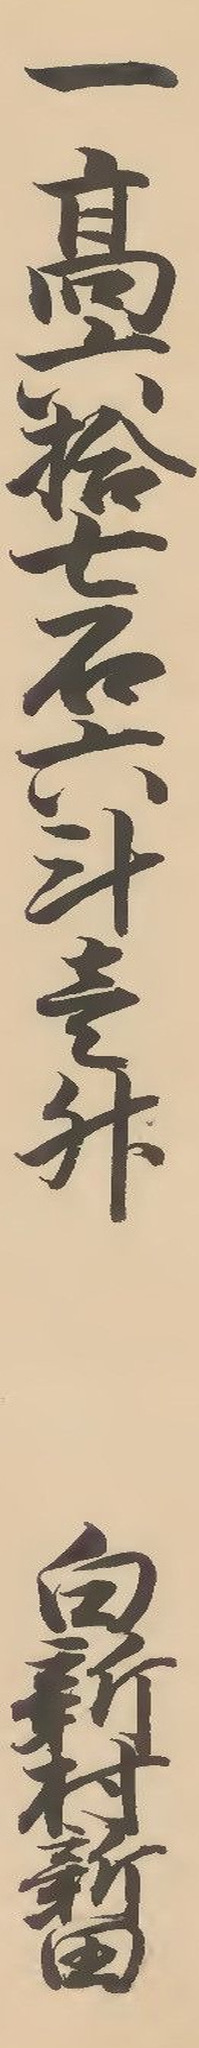一髙六拾七石六斗壱升白新村新田
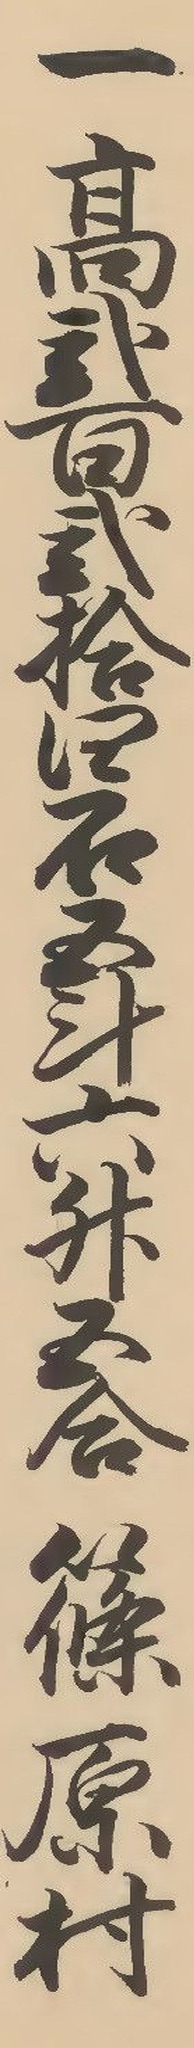一髙弐百弐拾四石五斗六升五合篠原村
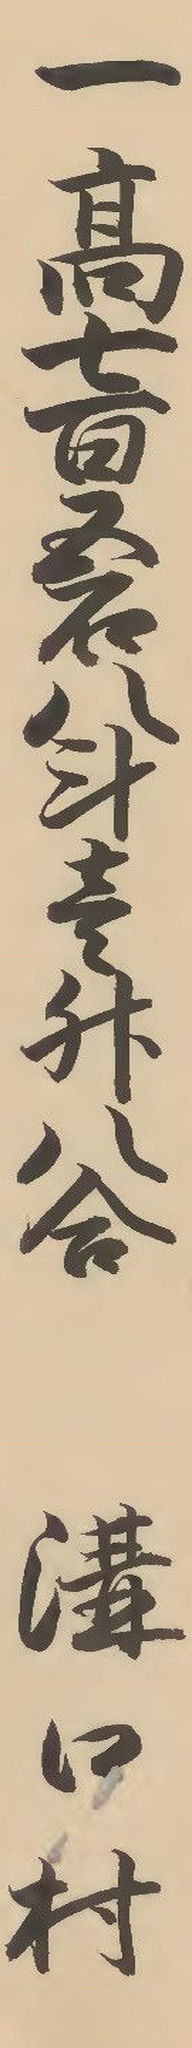一髙七百五石八斗壱升八合溝口村
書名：播磨国郷帳
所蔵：国立公文書館 National Archives of Japan
